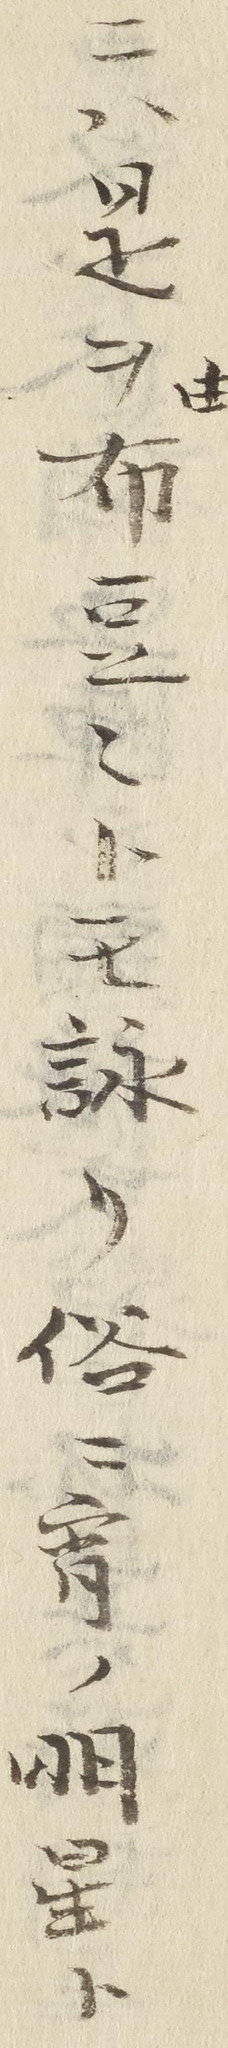ニハ是ヲ布豆々トモ詠リ俗ニ宵ノ明星ト
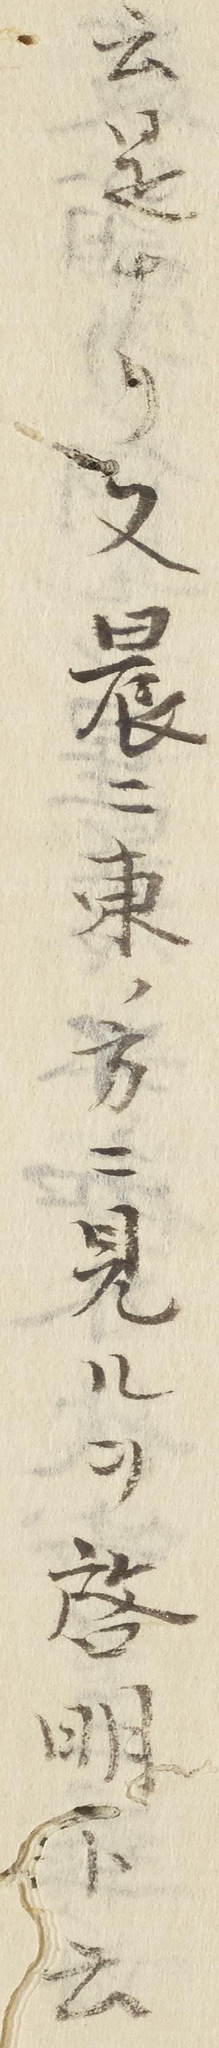云是ナリ又晨ニ東ノ方ニ見ルヲ啓明ト云
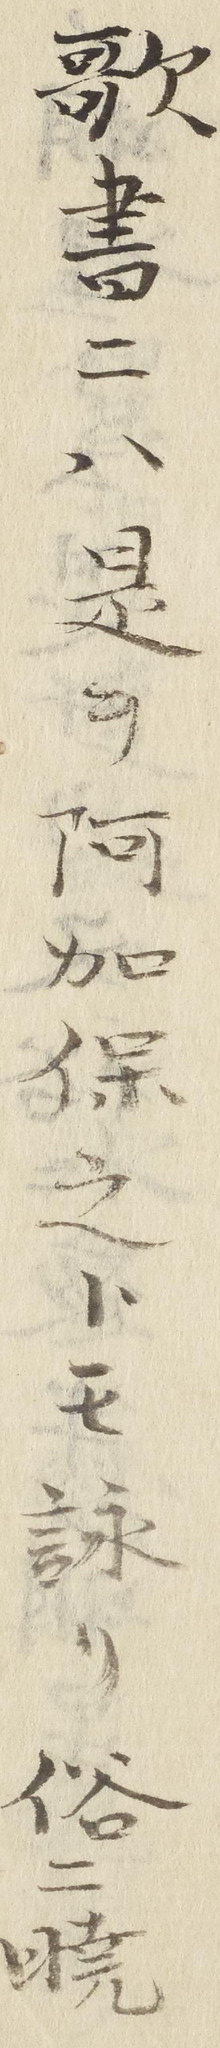歌書ニハ是ヲ阿加保之トモ詠リ俗ニ暁

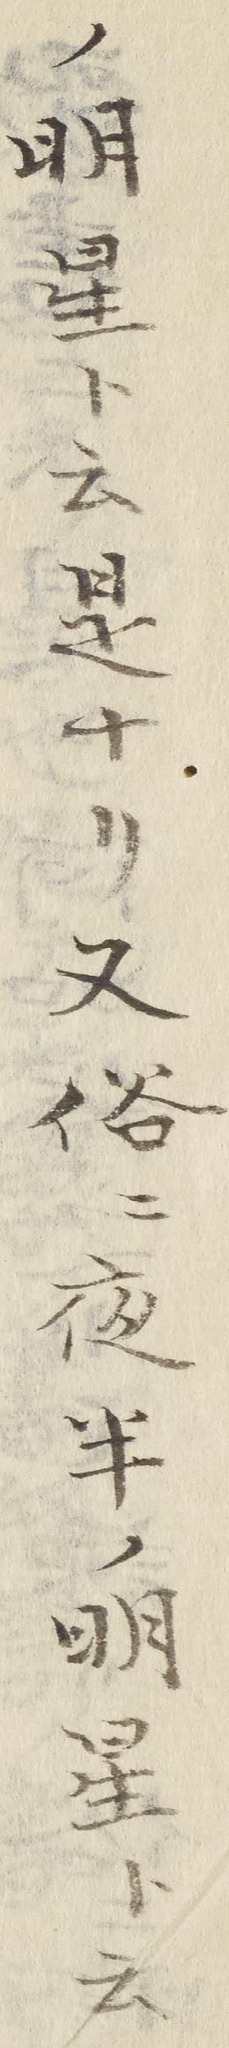ノ明星ト云是ナリ又俗ニ夜半ノ明星ト云
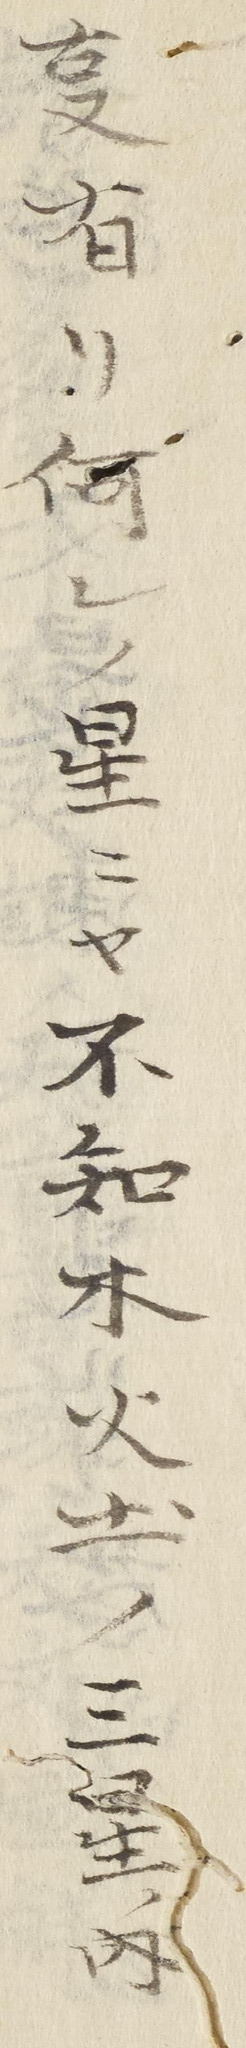事有リ何レノ星ニヤ不知木火土ノ三星内
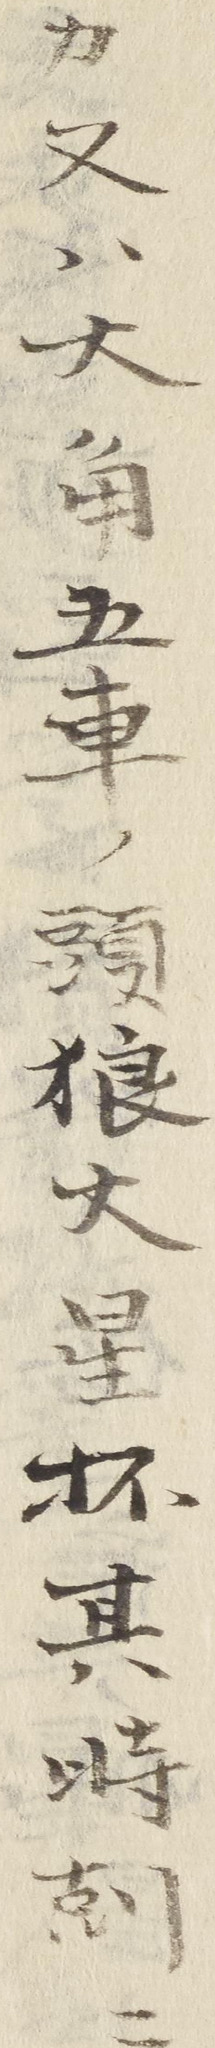カ又ハ大角五車ノ頭狼大星抔其時剋ニ
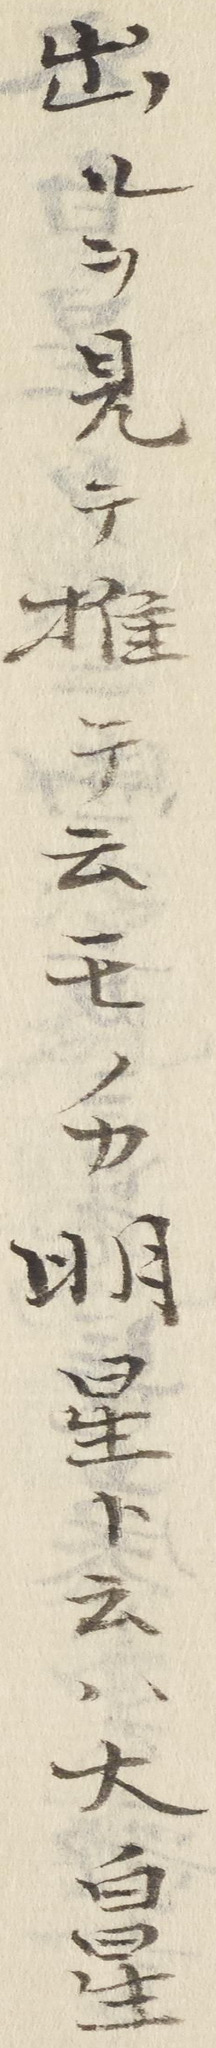出ルヲ見テ推テ云モノカ明星ト云ハ大白星
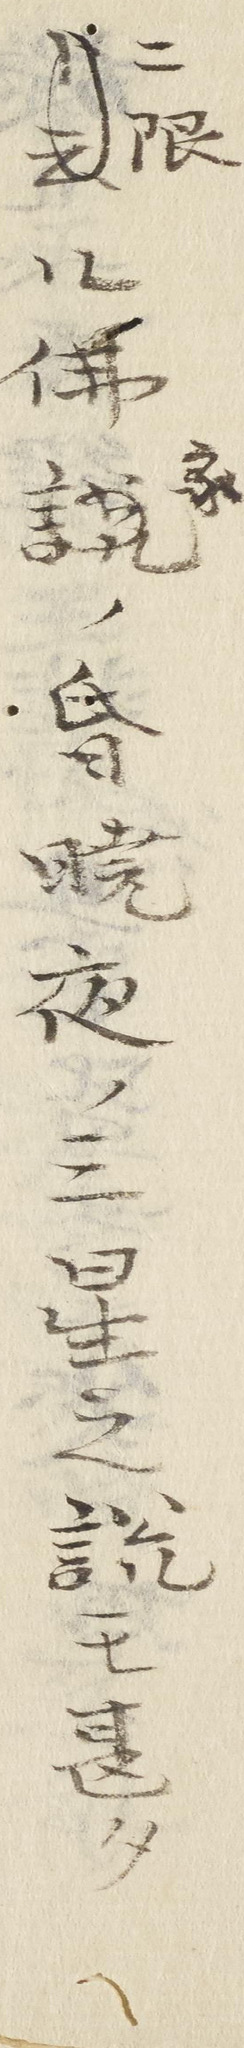ト云ル仏説ノ昏暁夜ノ三星之説モ甚タ
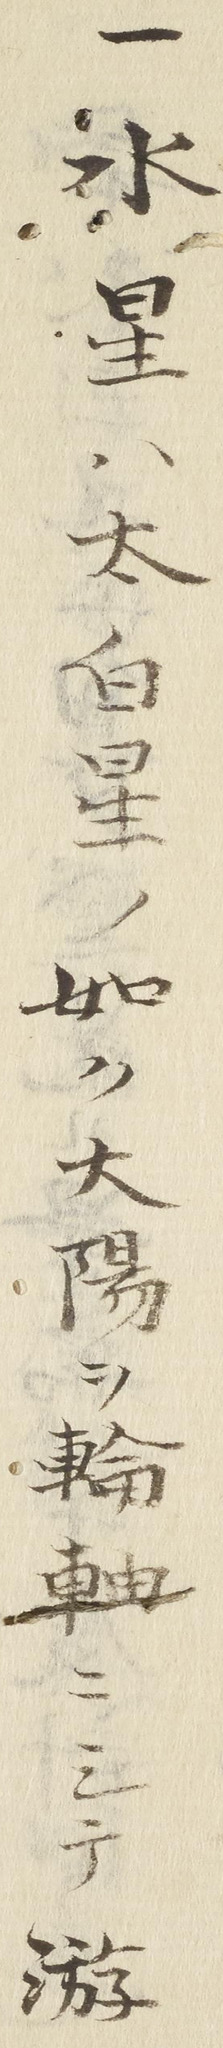一水星ハ太白星ノ如ク大陽ヲ輪軸ニシテ游
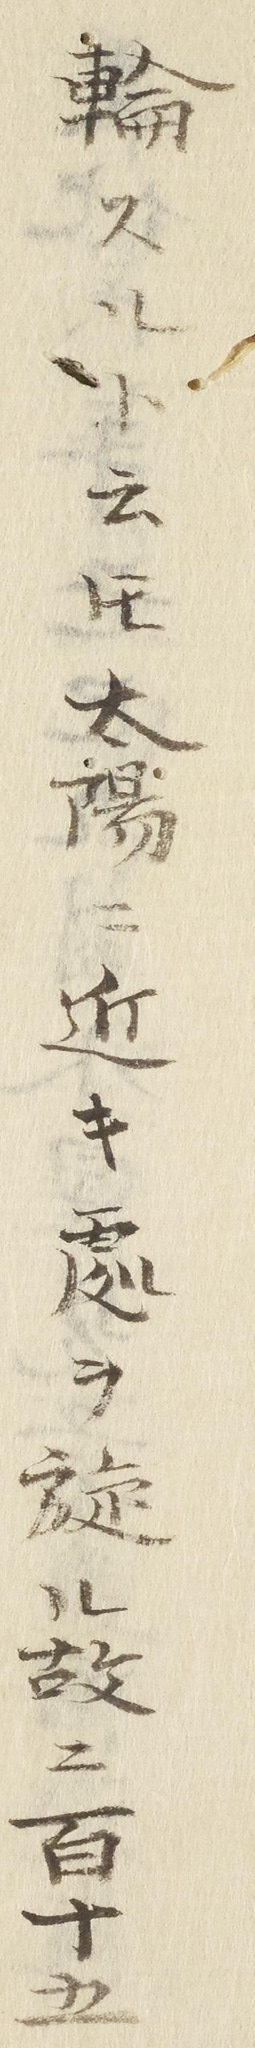輪スルト云トモ太陽ニ近キ処ヲ旋ル故ニ百十五
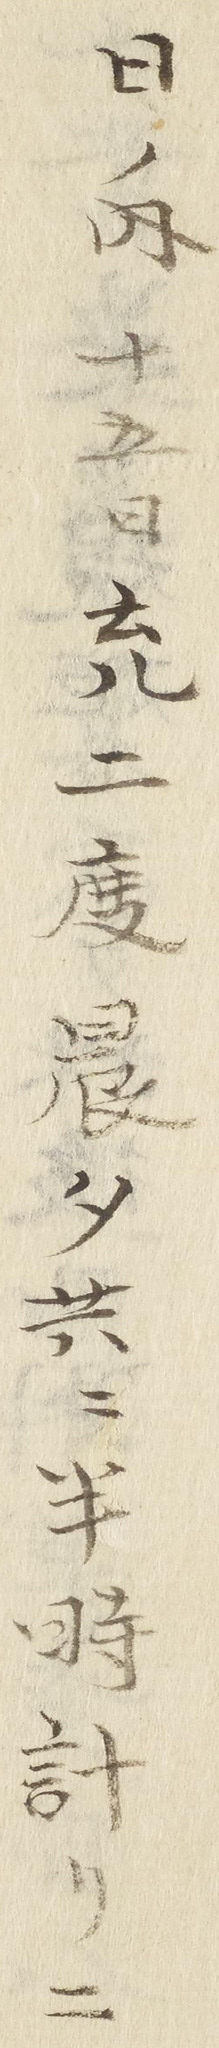日ノ内十五日充二度晨夕共ニ半時計リニ
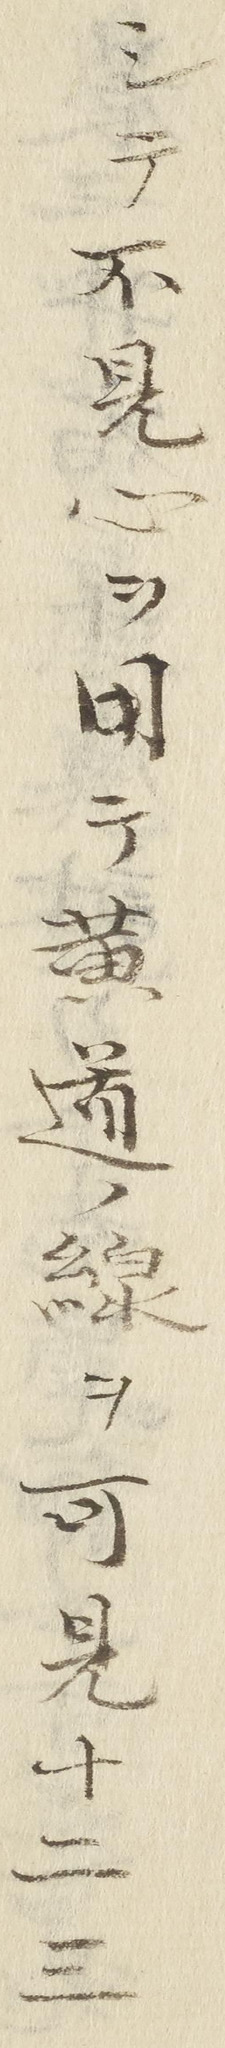シテ不見心ヲ用テ黄道ノ線ヲ可見十二三
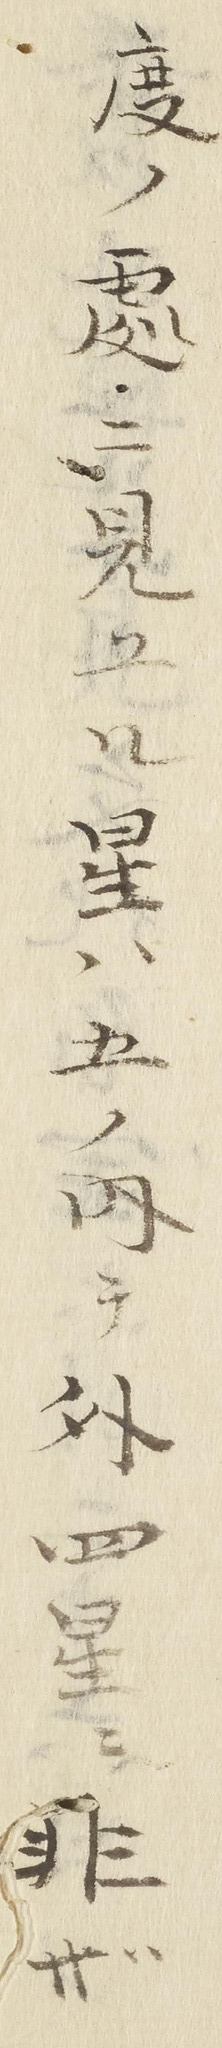度ノ処ニ見ユル星ハ五ノ内チ外四星ニ非ザ
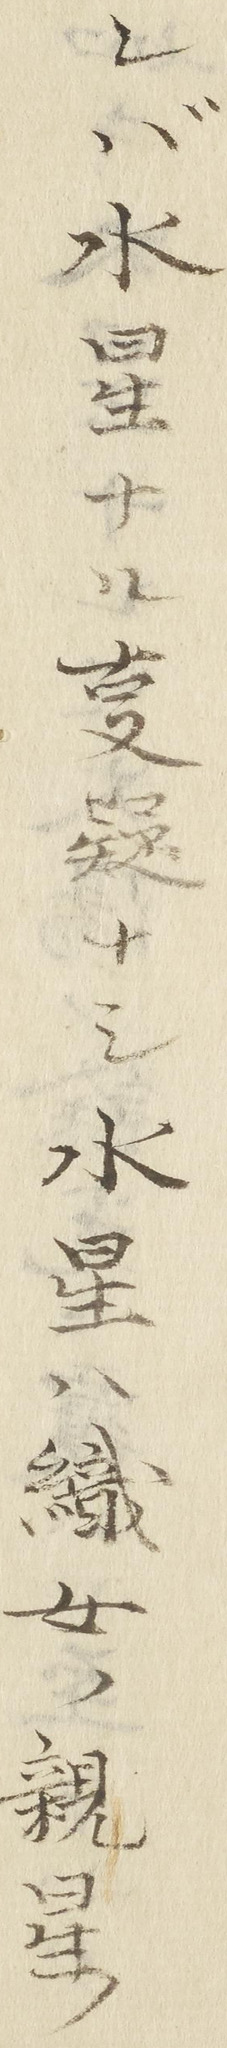レバ水星ナル事疑ナシ水星ハ織女ノ親星ノ

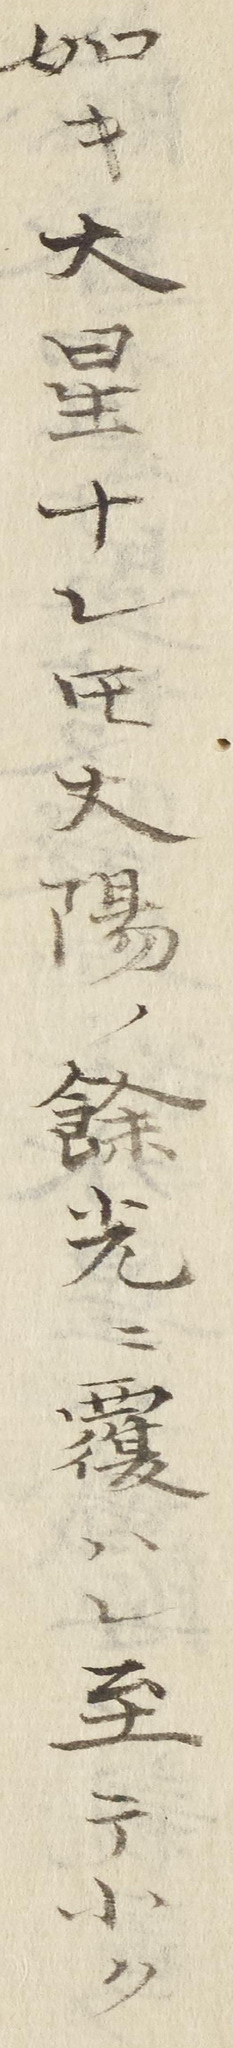如キ大星ナレトモ大陽ノ余光ニ覆ハレ至テ小ク
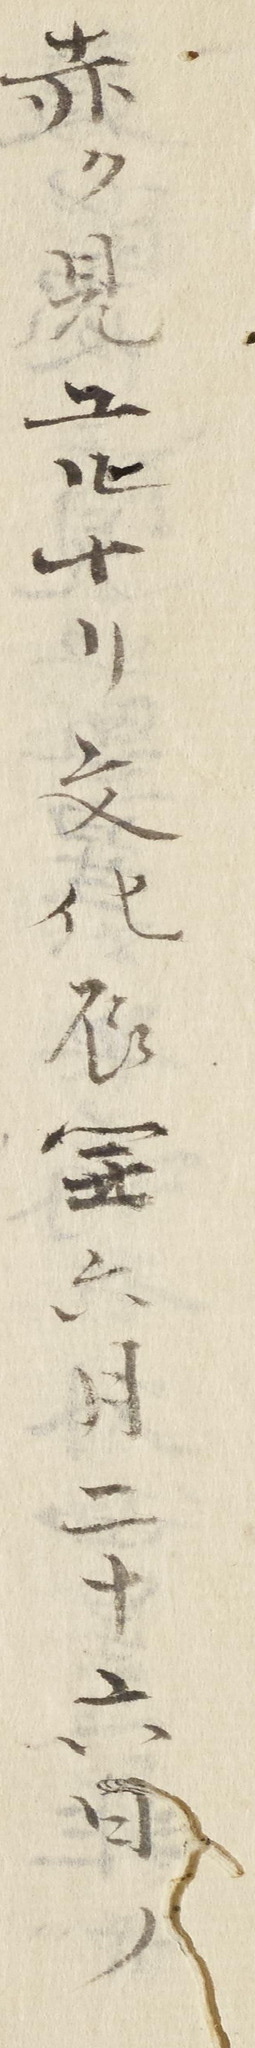赤ク見ユルナリ文化辰閏六月二十六日ノ
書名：天象話説
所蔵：東京大学地震研究所図書室 Earthquake Research Institute Library, The University of Tokyo, JAPAN
